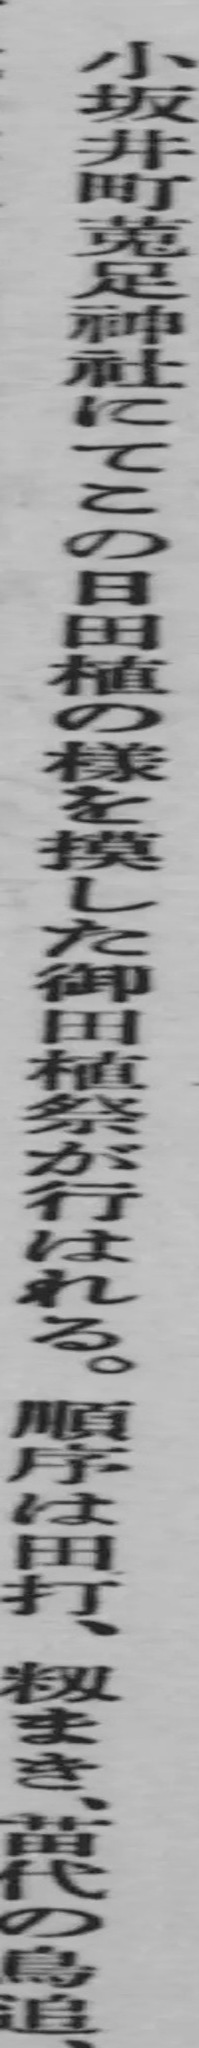小坂井町𫟏足神社にてこの日田植の様を摸した御田植祭が行はれる。順序は田打、籾まき、苗代の鳥追、
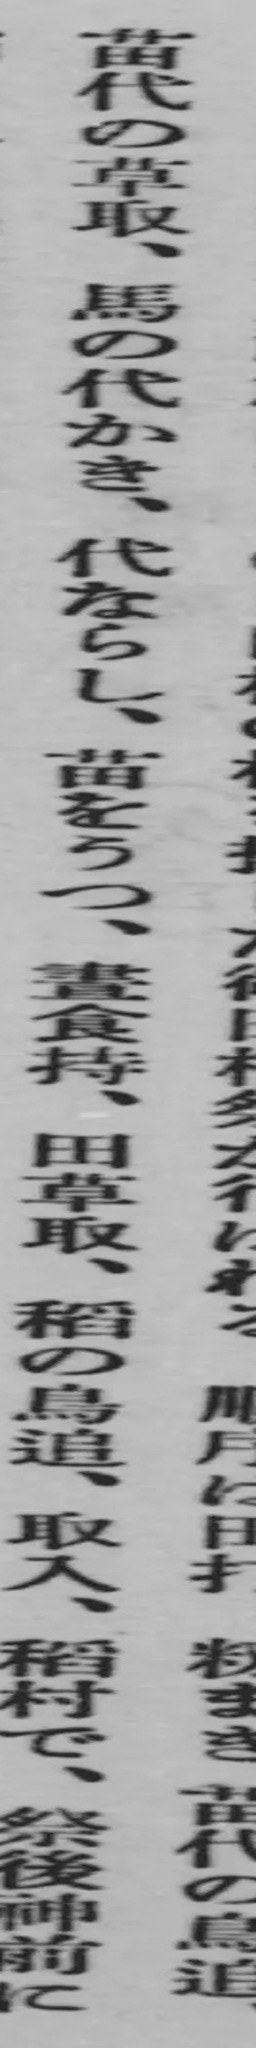苗代の草取、馬の代かき、代ならし、苗をうつ、晝食持、田草取、稻の鳥追、取入、稻村で、祭後神前に
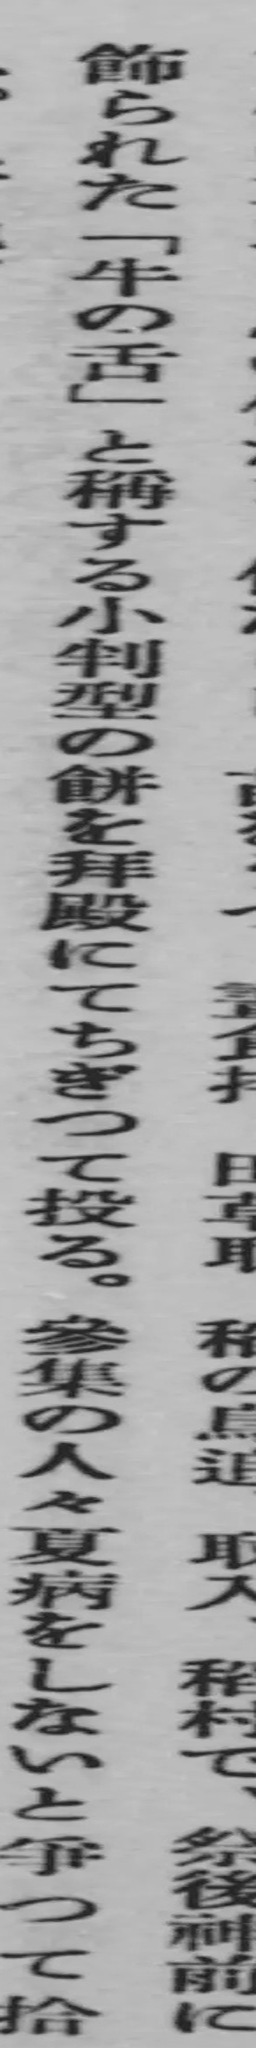飾られた「牛の舌」と稱する小判型の餅を拜殿にてちぎつて投る。參集の人々夏病をしないと爭つて拾
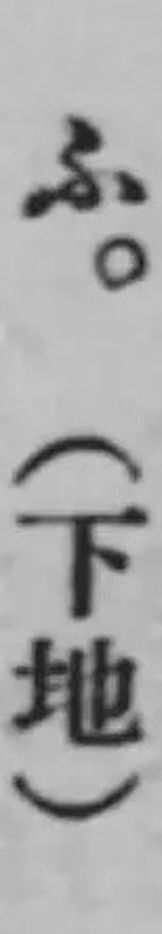ふ。(下地)
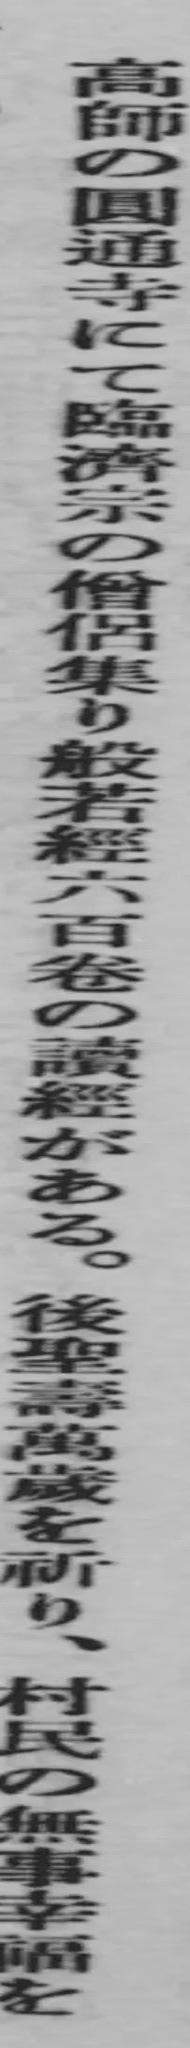高師の圓通寺にて臨濟宗の僧侶集り般若經六百卷の讀經がある。後聖壽萬歲を祈り、村民の無事幸福を
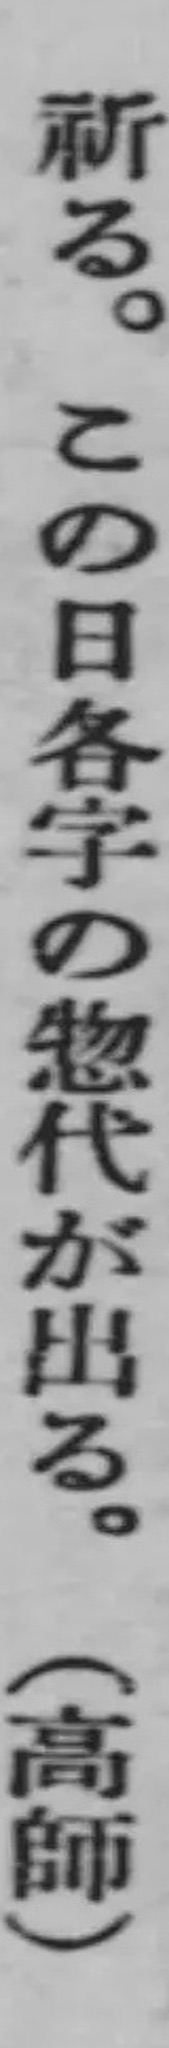祈る。この日各字の惣代が出る。(高師)
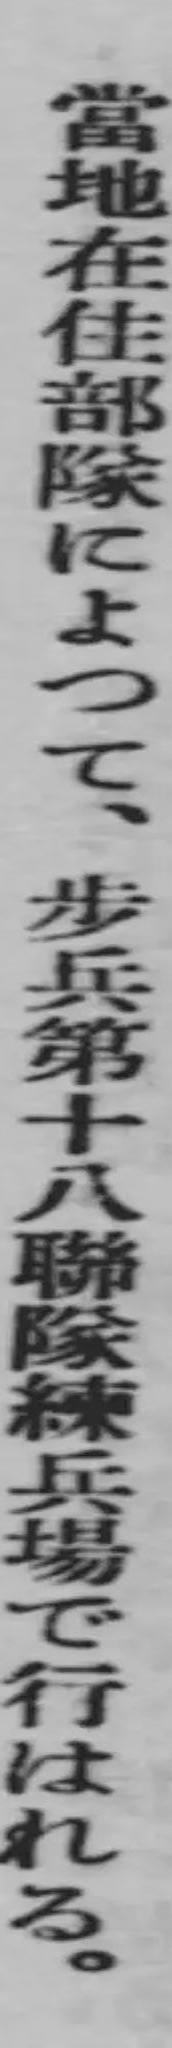當地在住部隊によつて、歩兵第十八聯隊練兵場で行はれる。

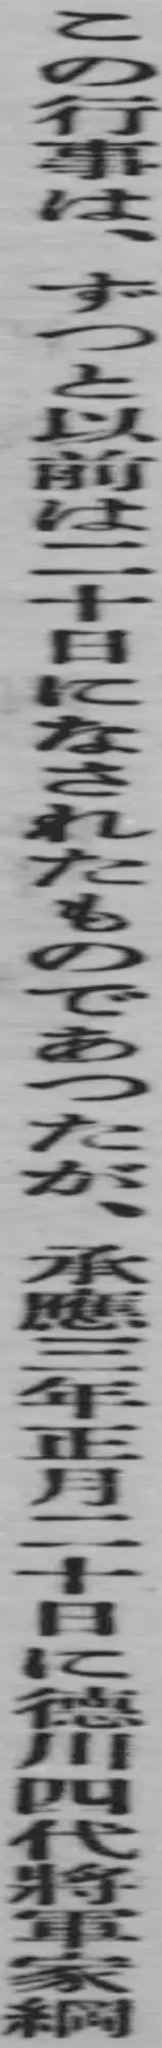この行事は、ずつと以前は二十日になされたものであつたが、承應三年正月二十日に徳川四代將軍家綱
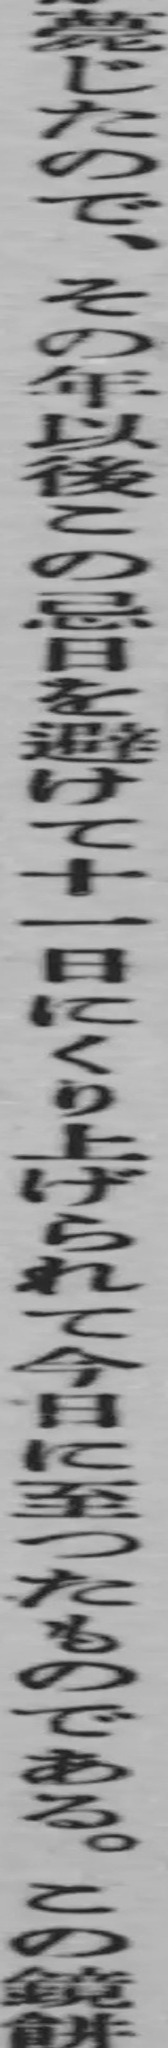が薨じたので、その年以後この忌日を避けて十一日にくり上げられて今日に至つたものである。この鏡餅
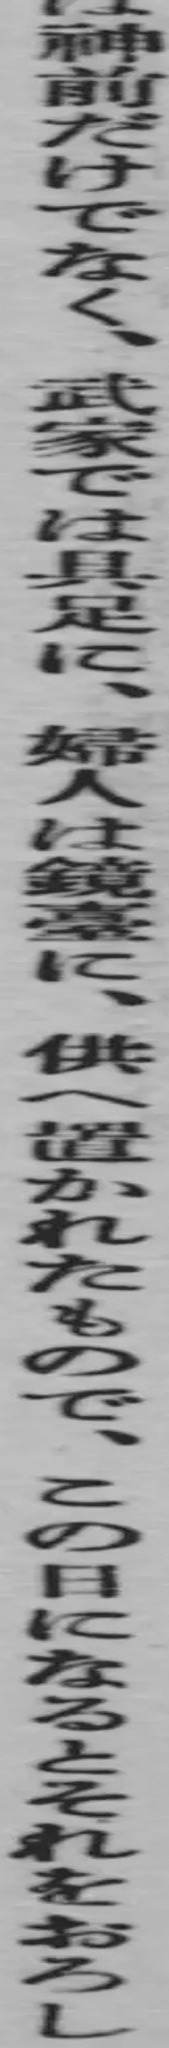は神前だけでなく、武家では具足に、婦人は鏡臺に、供へ置かれたもので、この日になるとそれをおろし
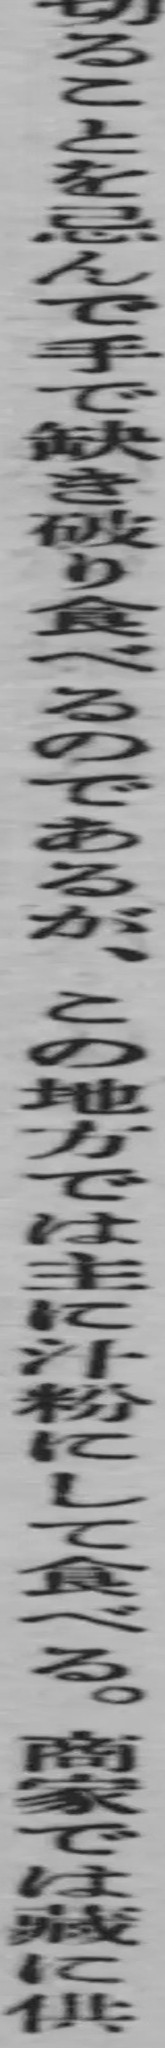切ることを忌んで手で缺き破り食べるのであるが、この地方では主に汁粉にして食べる。商家では藏に供
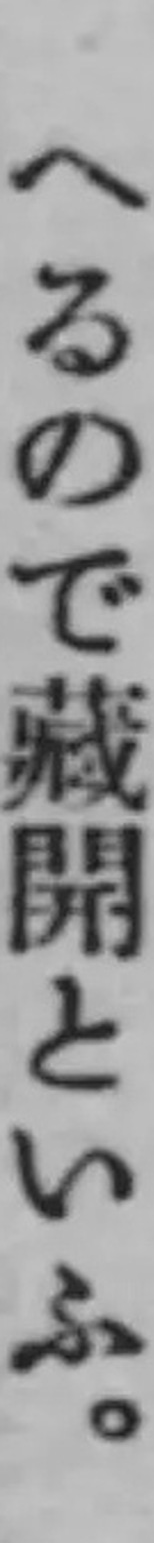へるので藏開きといふ。
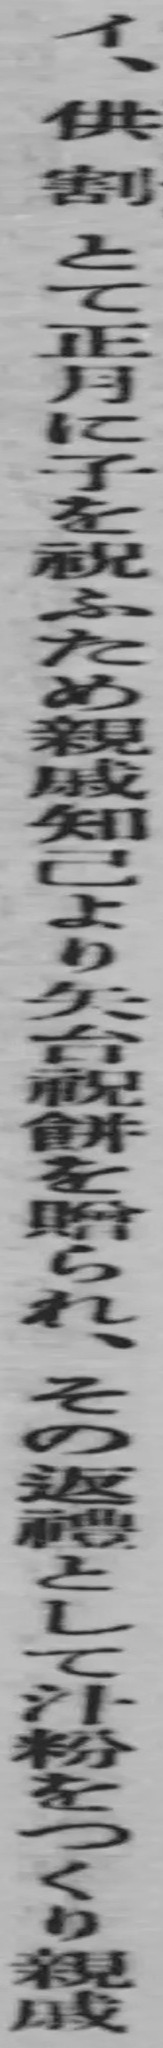イ、供割とて正月に子を祝ふため親戚知己より矢台祝餅を贈られ、その返禮として汁粉をつくり親戚
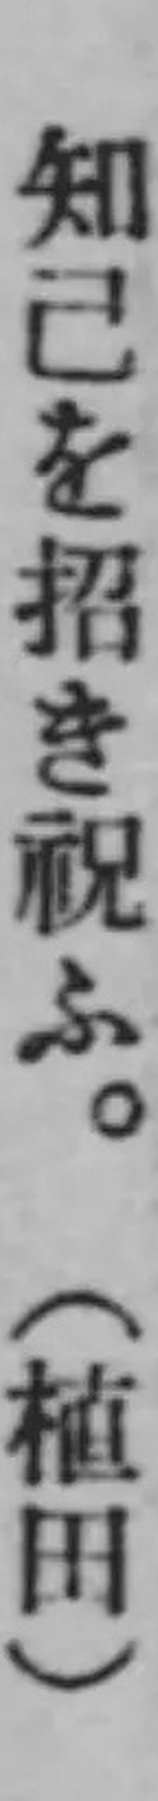知己を招き祝ふ、(植田)
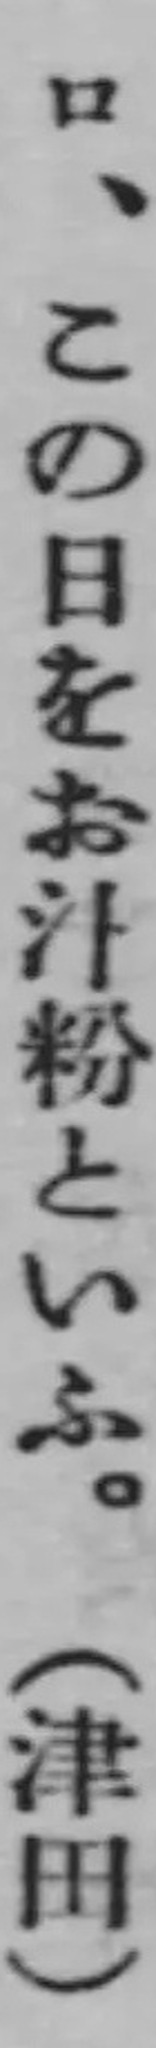ロ、この日をお汁粉といふ。(津田)
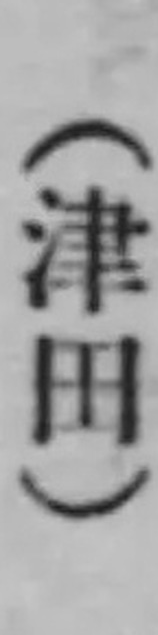(津田)
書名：豊橋の年中行事
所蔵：国立国会図書館 National Diet Library, JAPAN
